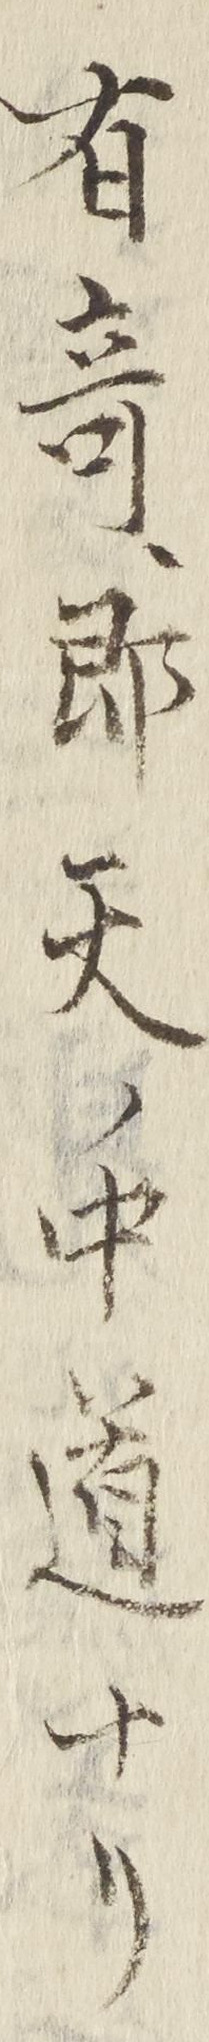有奇、即天ノ中道ナリ
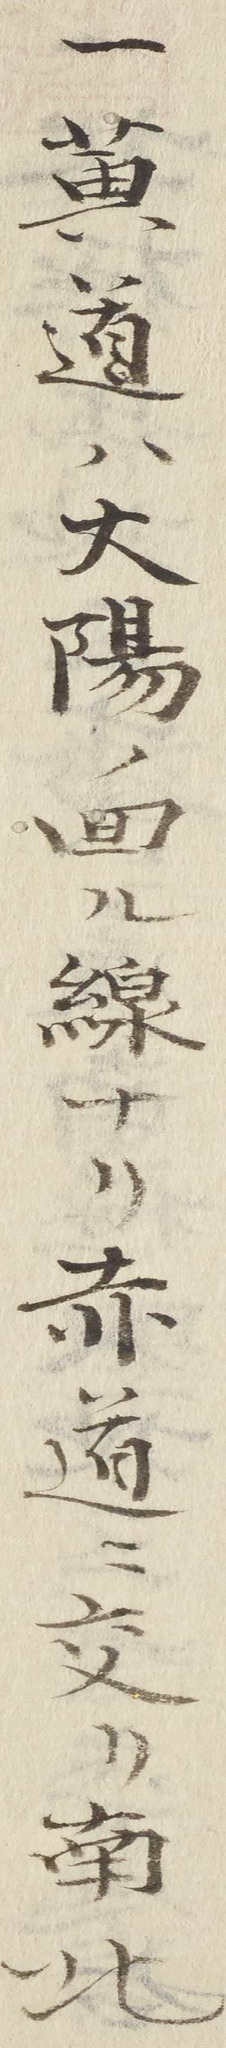一黄道ハ大陽ノ回ル線ナリ赤道ニ交リ南北
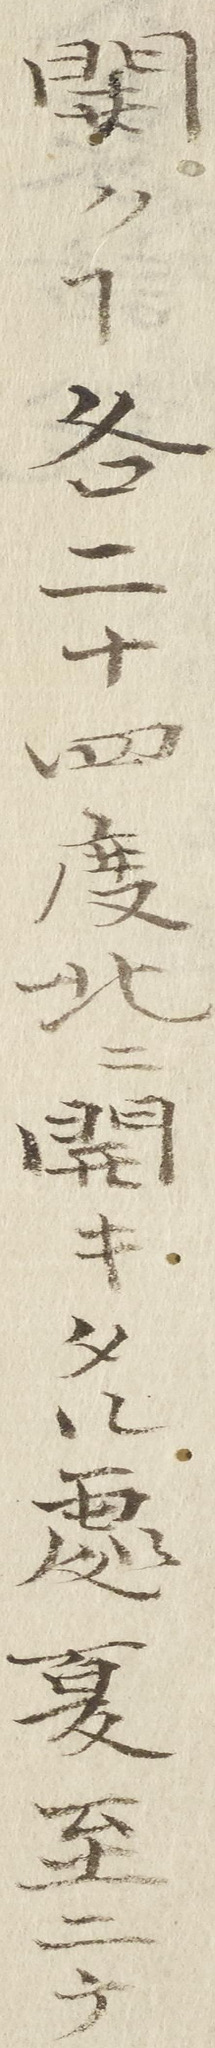開クコト各二十四度北ニ開キタル処夏至ニテ
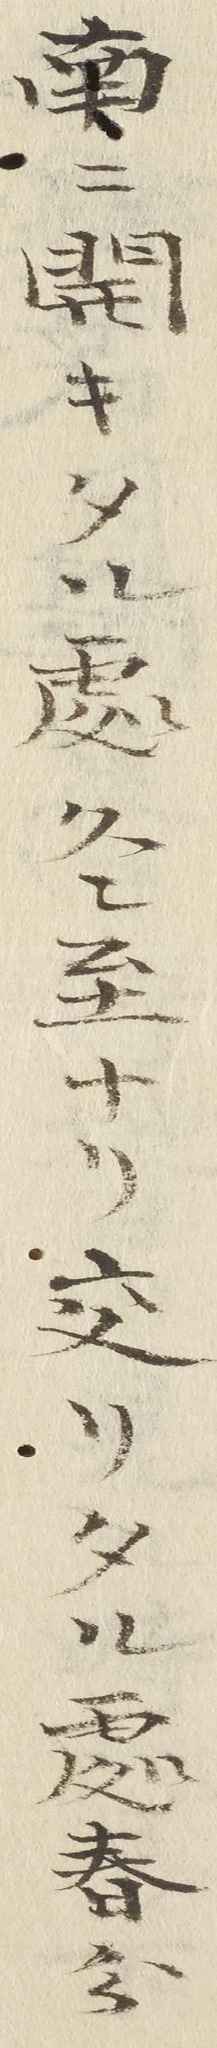南ニ開キタル処冬至ナリ交リタル処春分
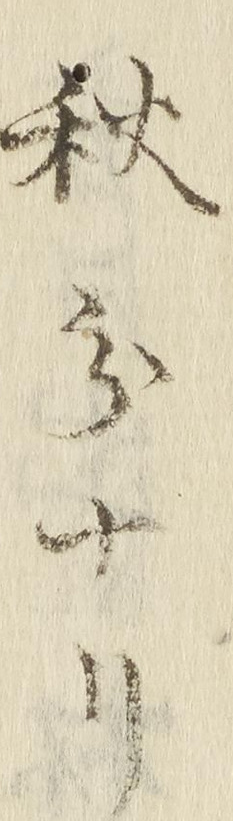秋分ナリ
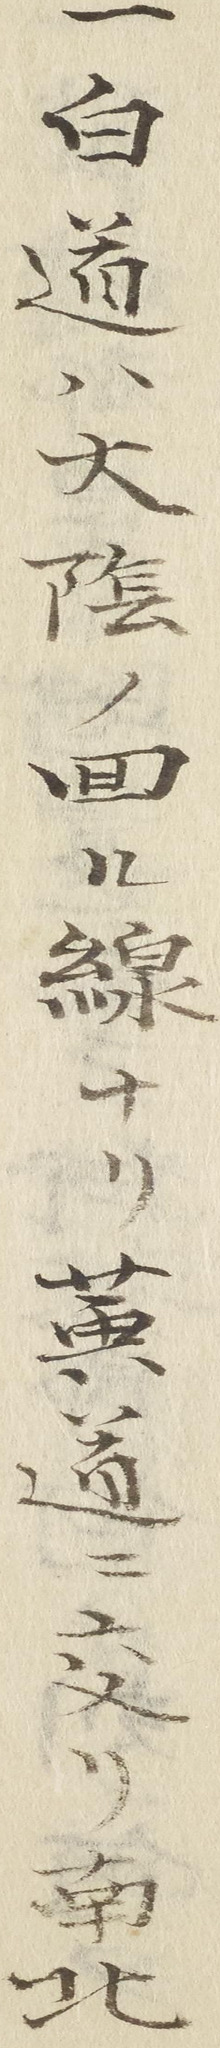一白道ハ大陰ノ回ル線ナリ黄道ニ交リ南北
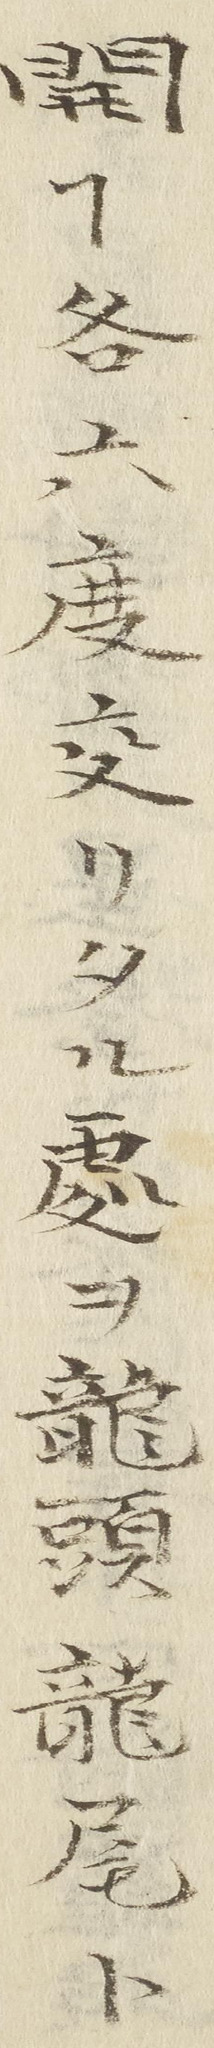開コト各六度交リタル処ヲ龍頭龍尾ト
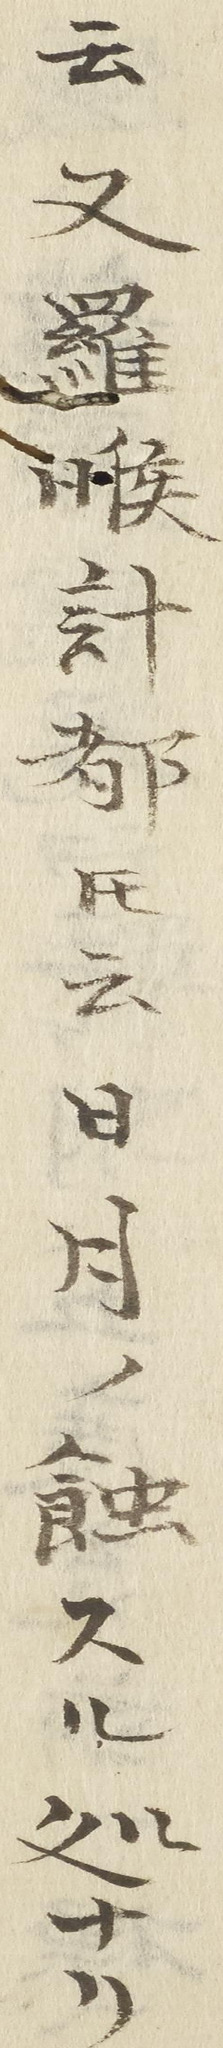云又羅睺計都トモ云日月ノ蝕スル処ナリ
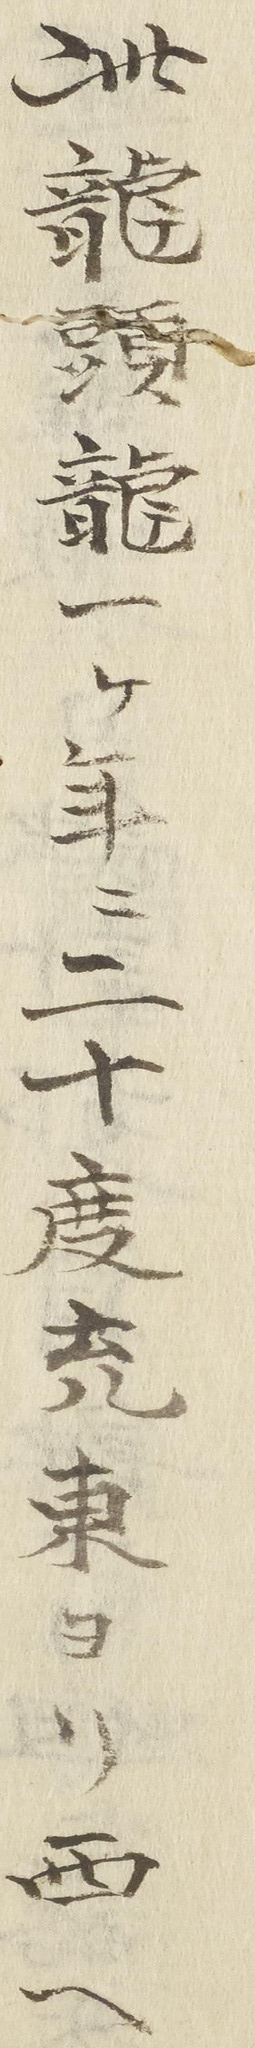此龍頭龍一ヶ年ニ二十度充東ヨリ西ヘ

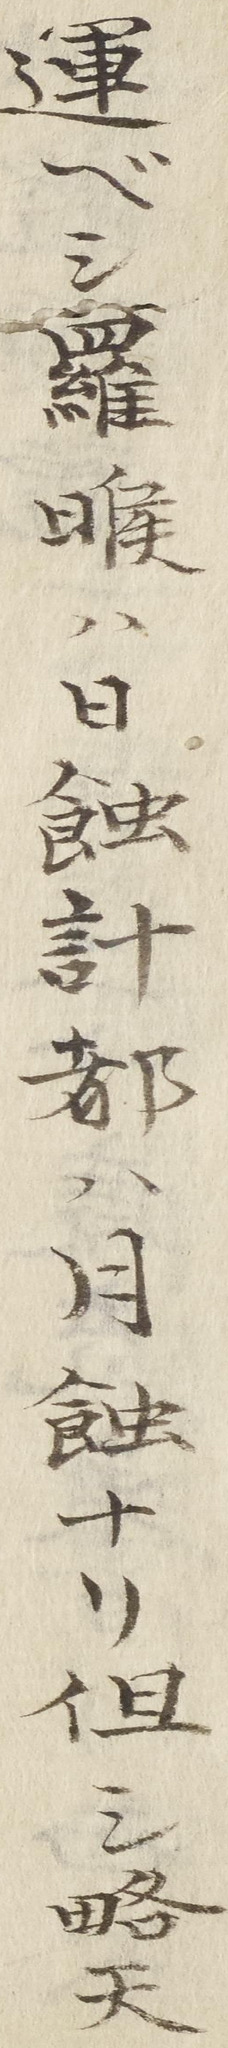運ベシ羅睺ハ日蝕計都ハ月蝕ナリ但シ略天
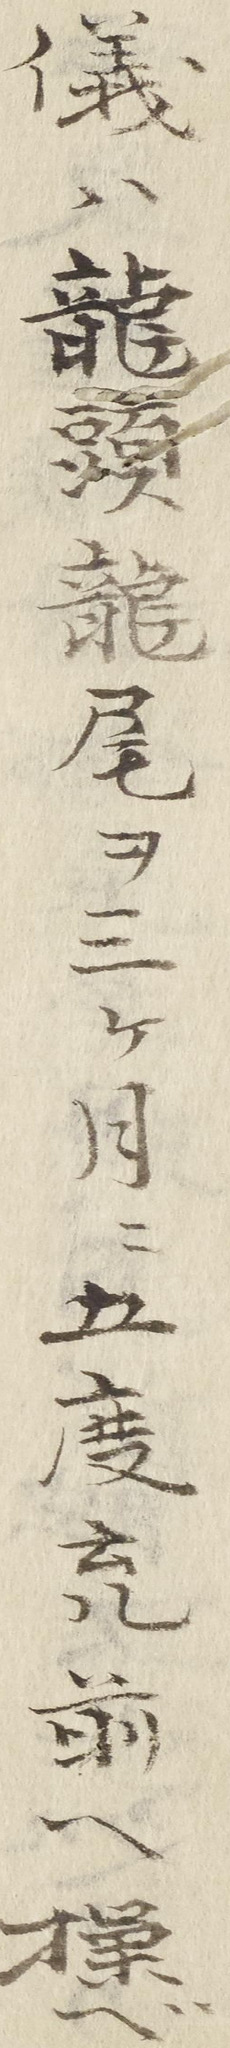儀ハ龍頭龍尾ヲ三ヶ月ニ五度充前ヘ操ベ
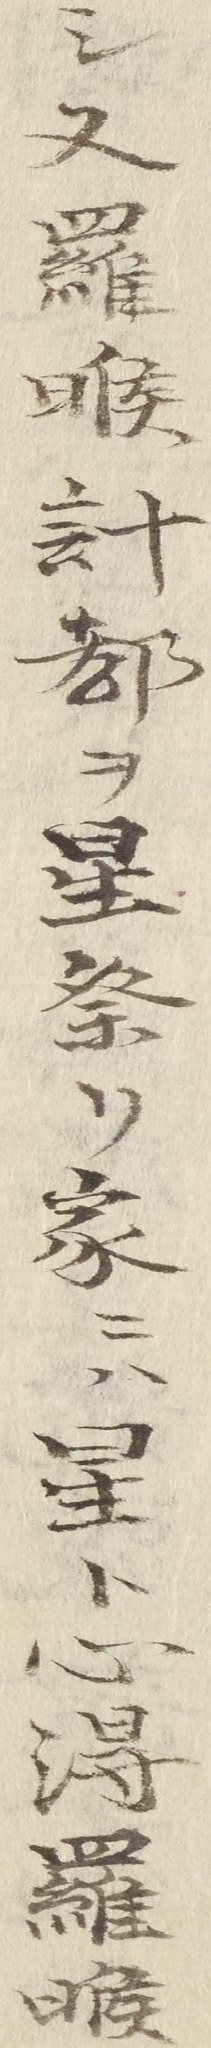シ又羅睺計都ヲ星祭リ家ニハ星ト心得羅睺
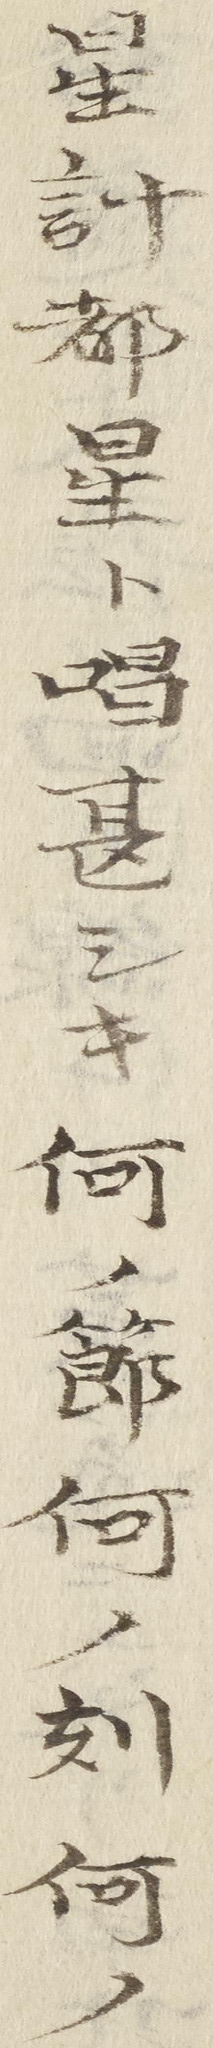星計都星ト唱甚シキ何ノ節何ノ刻何ノ
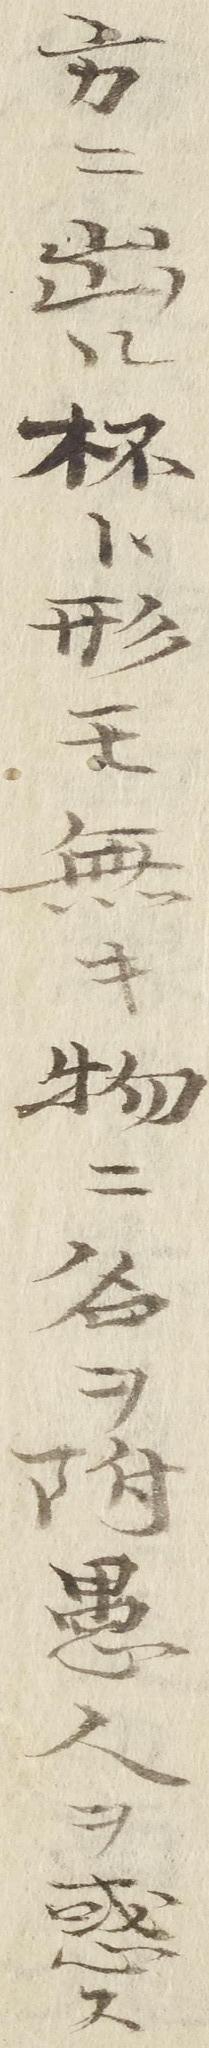方ニ出ル抔ト形モ無キ物ニ名ヲ附愚人ヲ惑ス
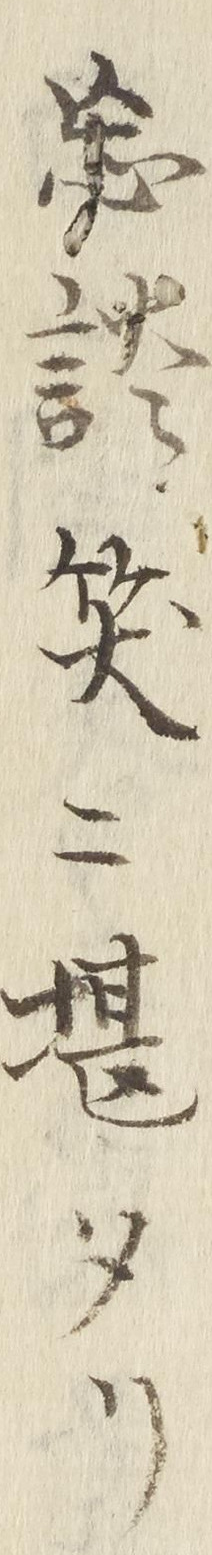㤀談笑ニ堪タリ
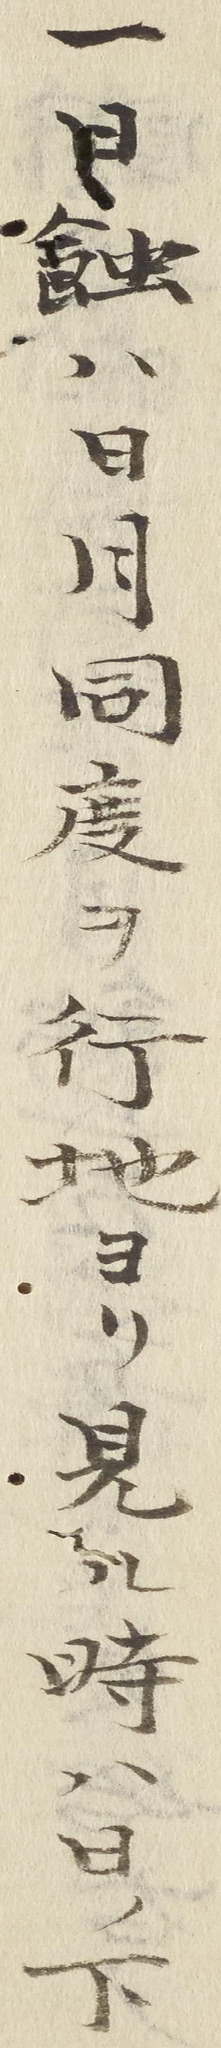一日蝕は日月同度ヲ行地ヨリ見ル時ハ日ノ下
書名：天象話説
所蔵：東京大学地震研究所図書室 Earthquake Research Institute Library, The University of Tokyo, JAPAN
